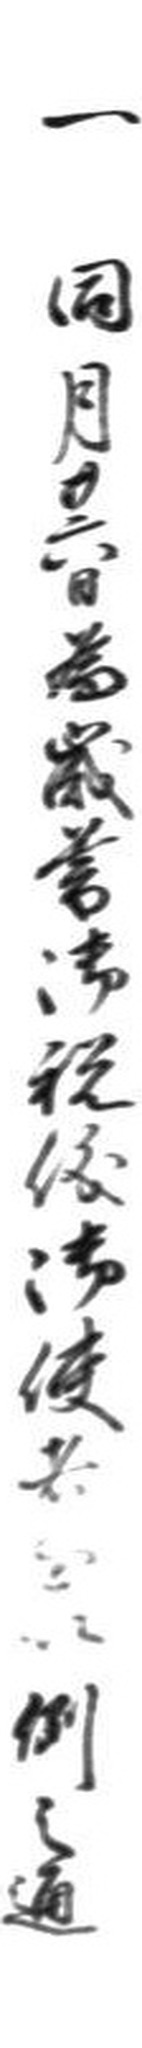一同月廿六日為歳暮御祝儀御使者を以例之通
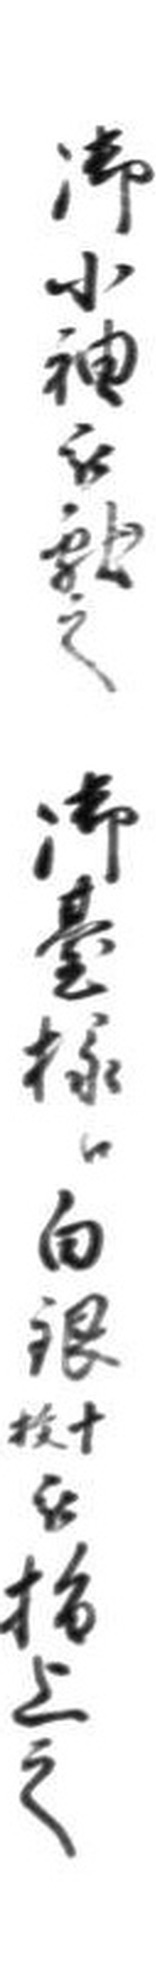御小袖被献之御臺様江白銀十枚被指上之
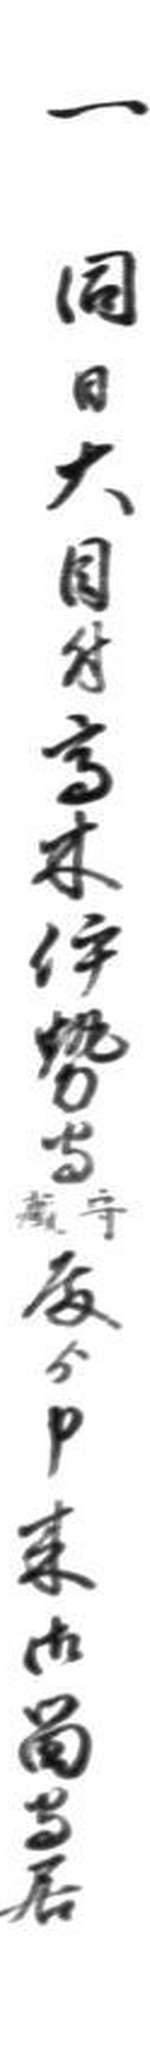一同日大目付高木伊勢守守蔵殿ゟ申来御留守居
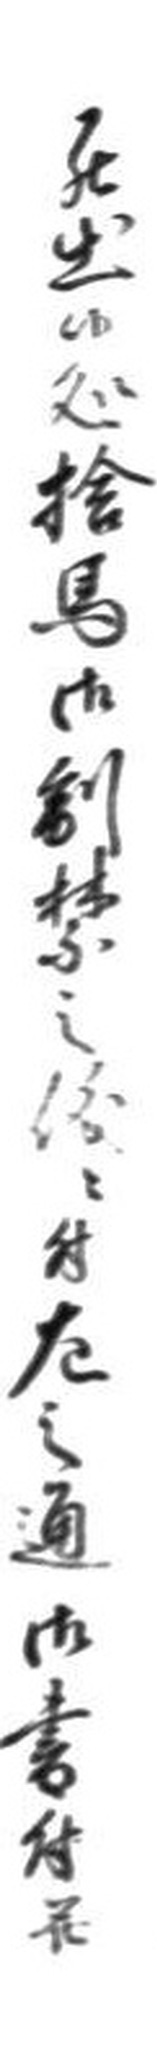罷出候処捨馬御制禁之儀ニ付左之通御書付并
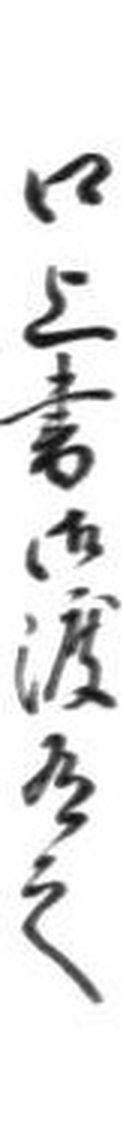口上書御渡有之

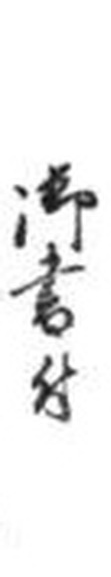御書付
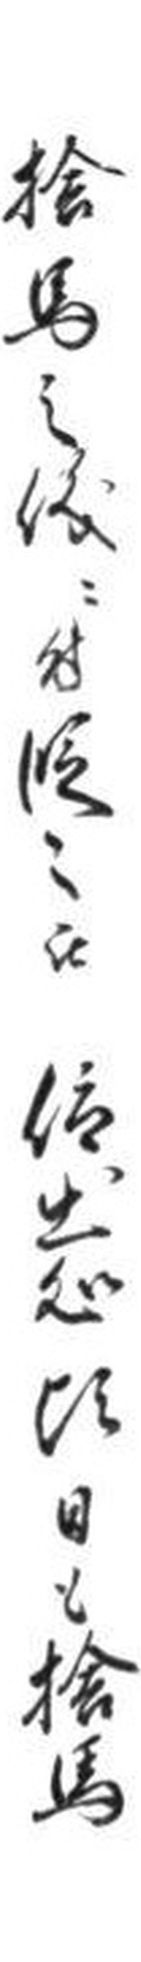捨馬之儀ニ付段々被仰出処頃日も捨馬
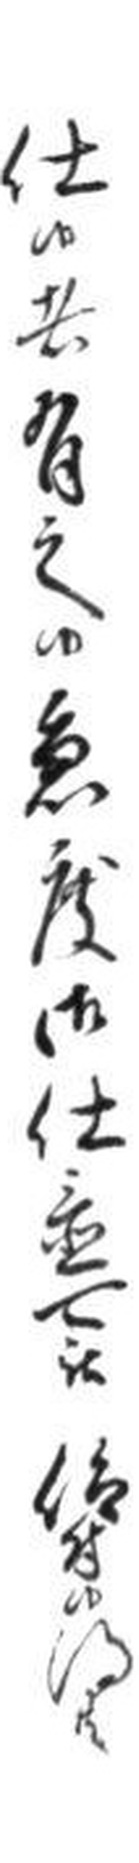仕候物有之候急度御仕置可被仰付候得共
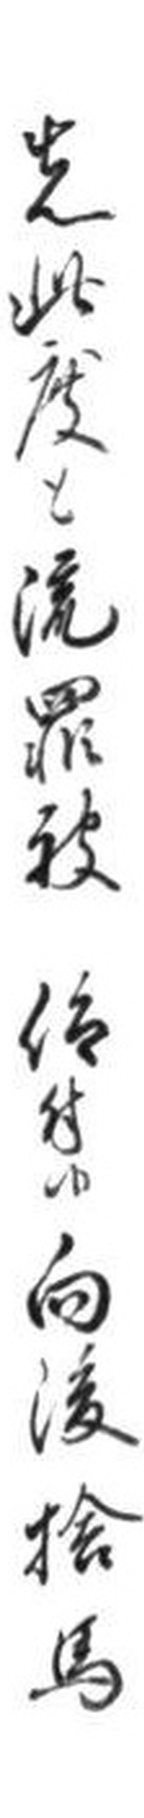先此度も流罪被仰付候向後捨馬
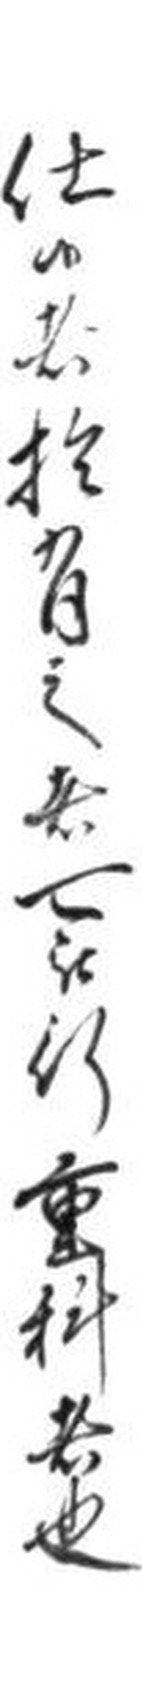仕候者抱有之者可被重科者也
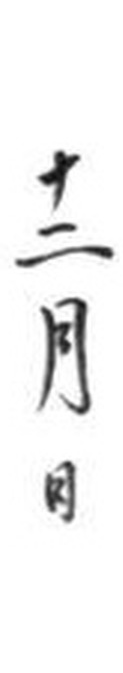十二月日
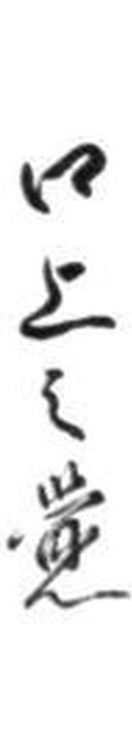口上之覚
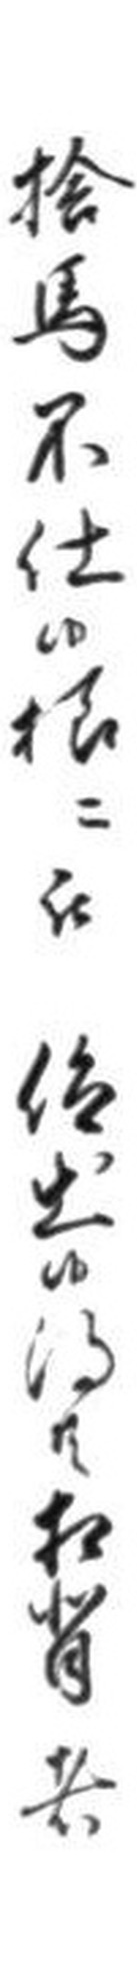捨馬不仕候様ニ被仰出候得共相背者
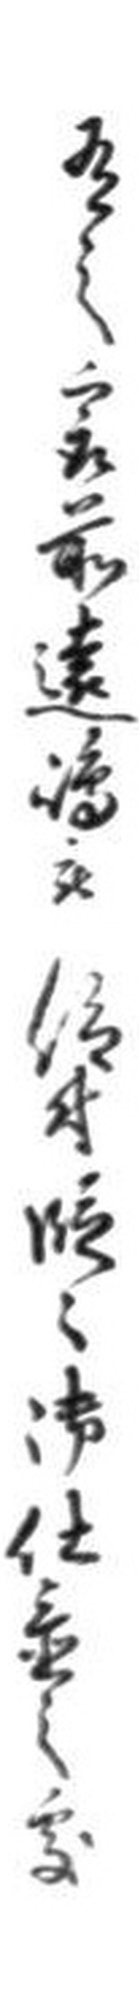有之最前遠嶋被仰付段々御仕置之處
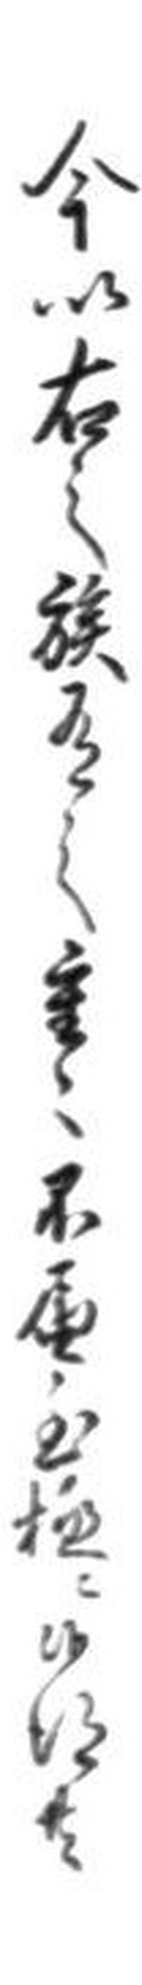今以右之族有之重々不届至極ニ候得共
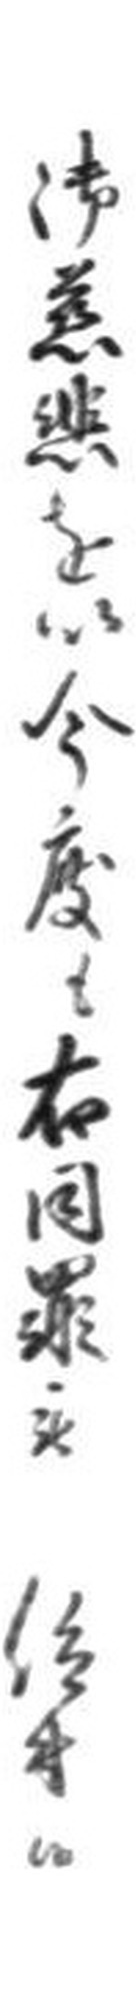御慈悲を以今度も右同罪被仰付候
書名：家譜 十六 吉品公 従貞享三年閏三月到同四年
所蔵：福井県文書館 Fukui Prefectural Archives
